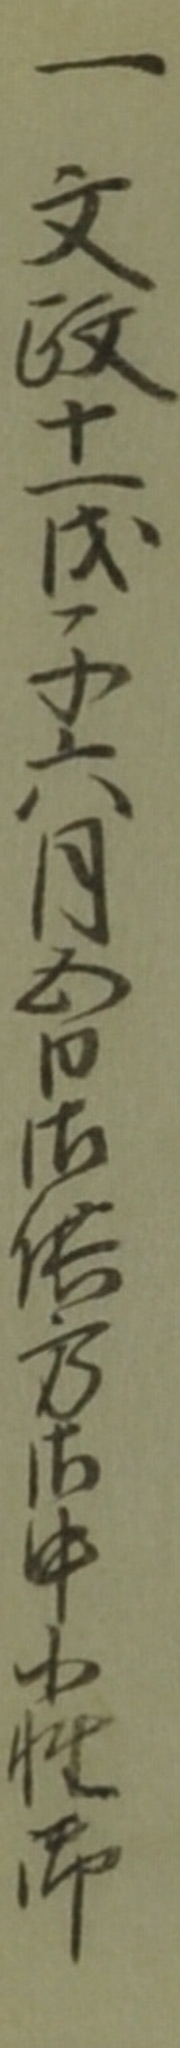一文政十一戊子六月五日御供方御中小性御
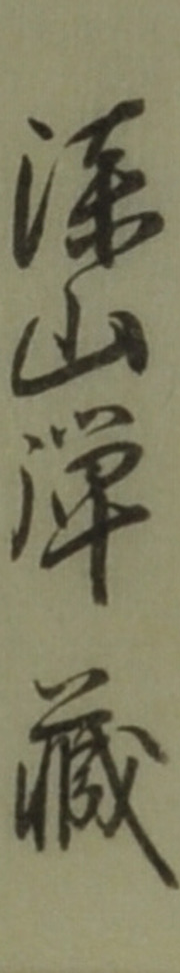深山弾蔵
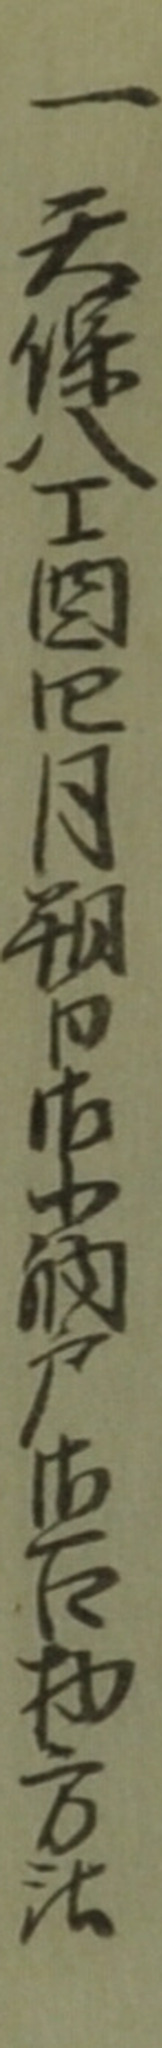一天保八丁酉四月朔日御小納戸御召物方被
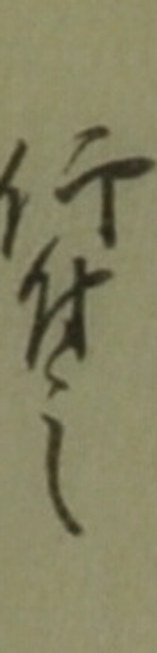仰付之
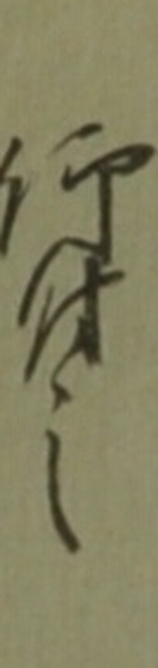仰付之
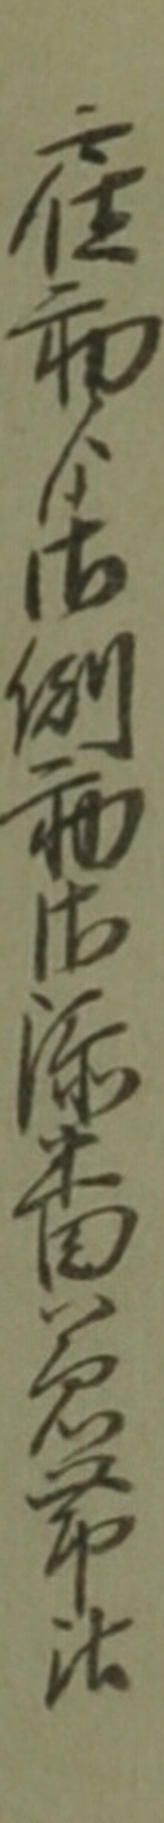雇勤ゟ御側勤御添番兼帯被
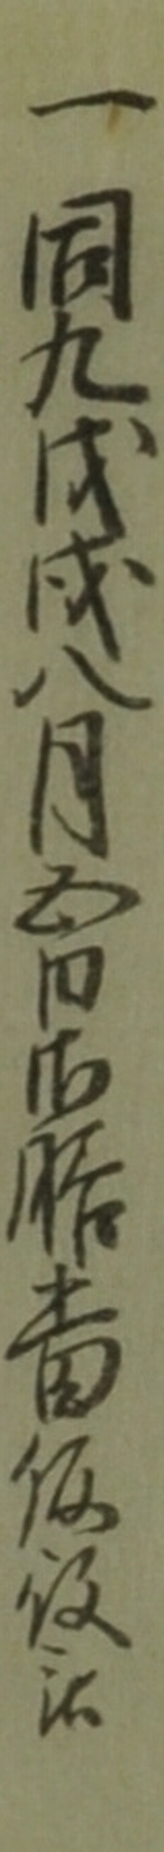一同九戊戌八月五日御膳番仮役被
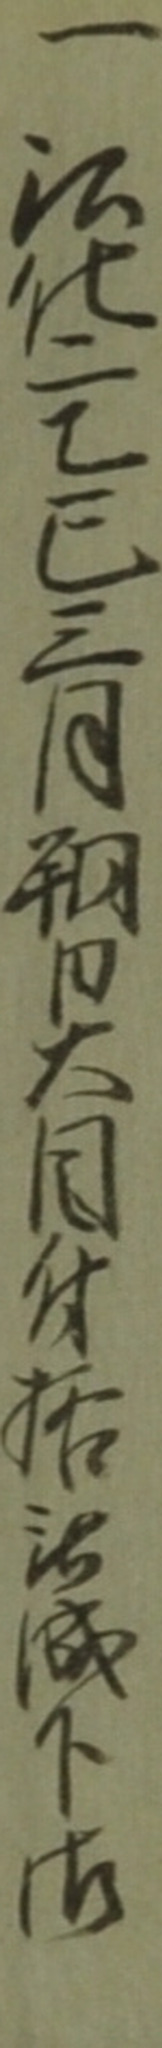一弘化二乙巳三月朔日大目付格被成下御
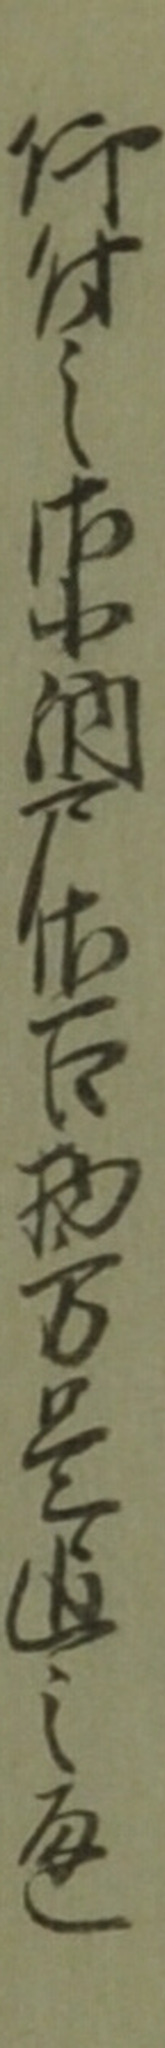仰付之御小納戸御召物方是迄之通
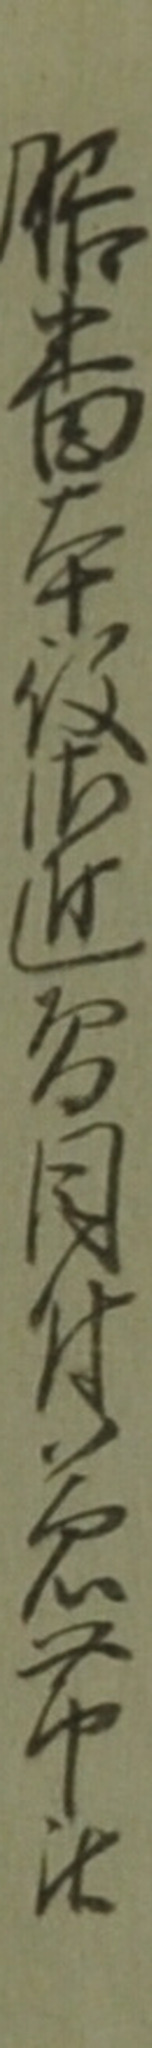膳番本役御近習目付兼帯被
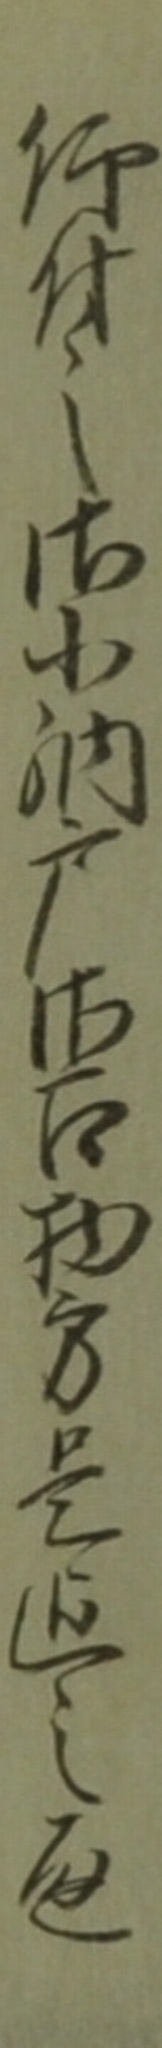仰付之御小納戸御召物方是迄之通

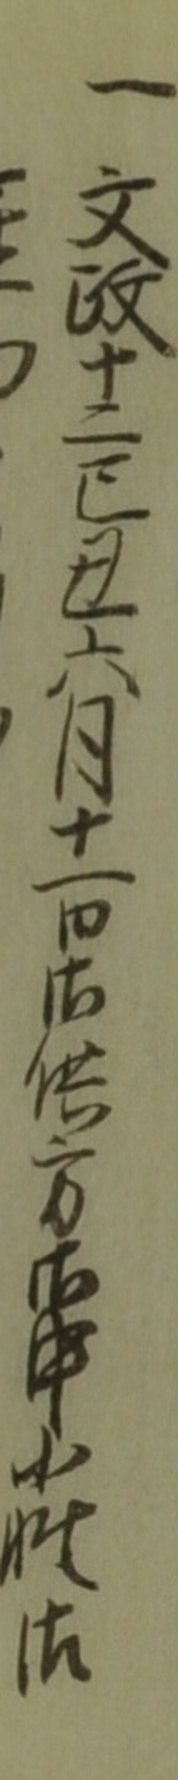一文政十二己丑六月十一日御供方御中小性御
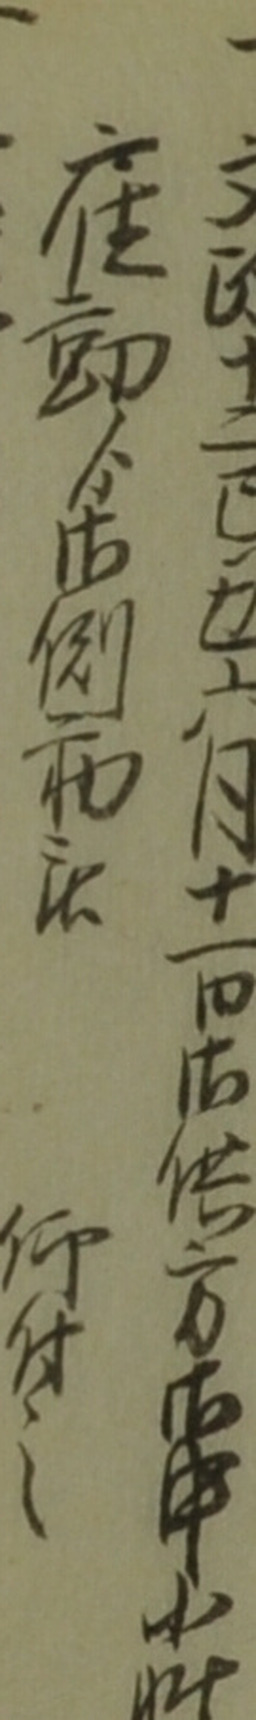雇勤ゟ御側勤被仰付之
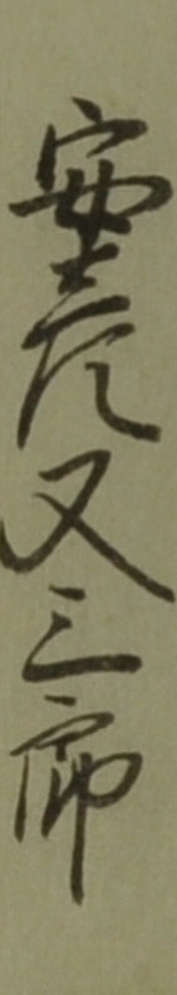安彦又三郎
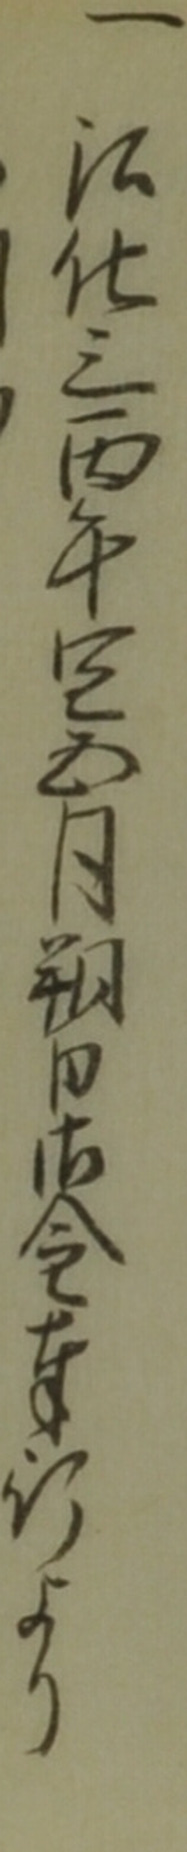一弘化三丙午閏五月朔日御金奉行より
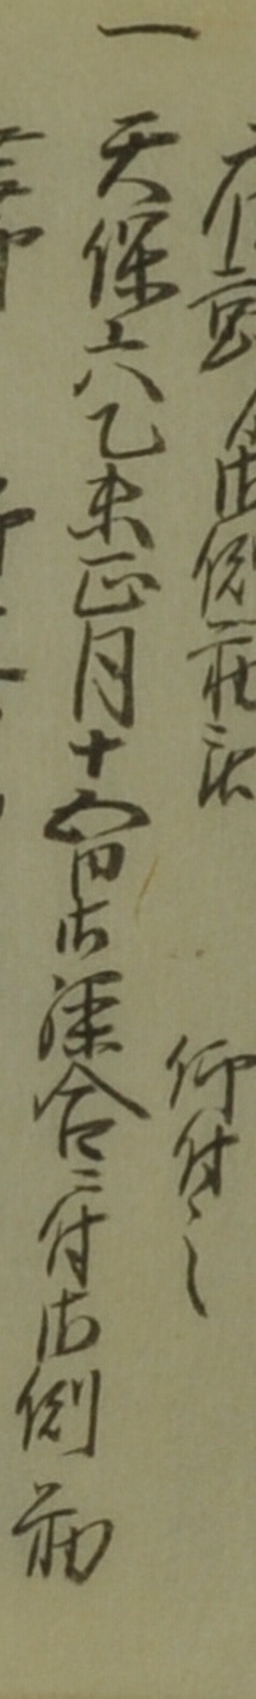一天保六乙未正月十五日御繰合ニ付御側勤
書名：諸御役代々録（五）
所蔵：伊那市立高遠町図書館・合同会社AMANE
